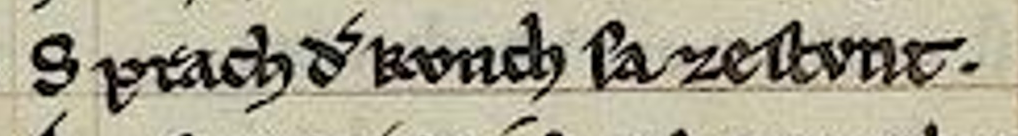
Sprach d(er) kvnch ſa zeſtvnt.
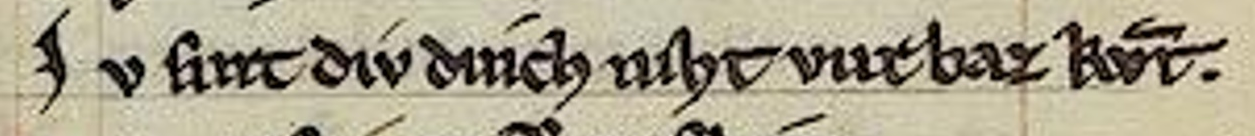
Iv ſint div dinch niht vur baz kv(n)t.
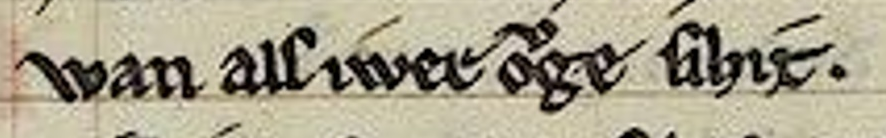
Wan alſ iwer o°vge ſihit.
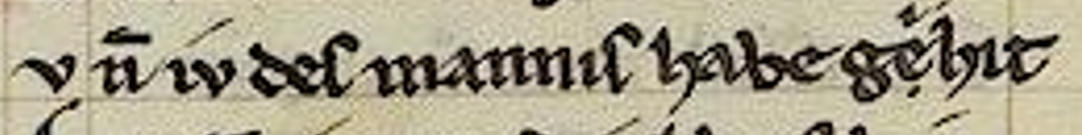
Vn(d) iv deſ manniſ habe ge°(i)hit
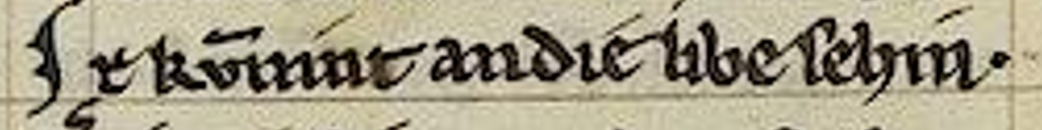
Ir kv(n)nint an die libe ſehin.
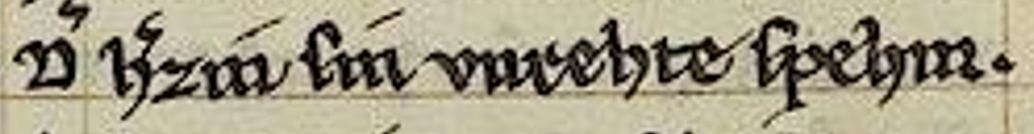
D(er) h(er)zin ſin vnrehte ſpehin.
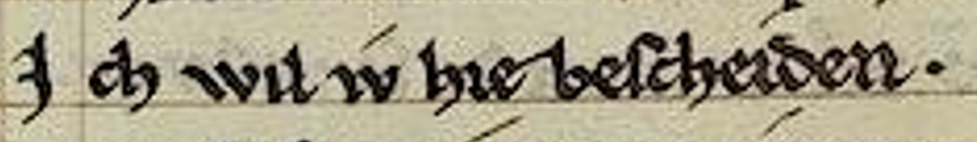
Ich wil iv hie beſcheiden.
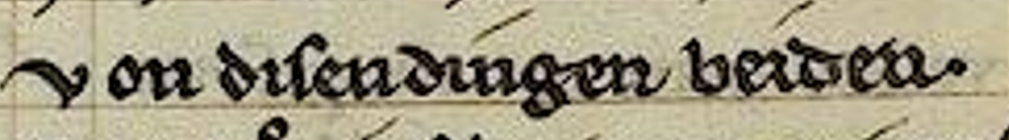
Von diſen dingen beiden.
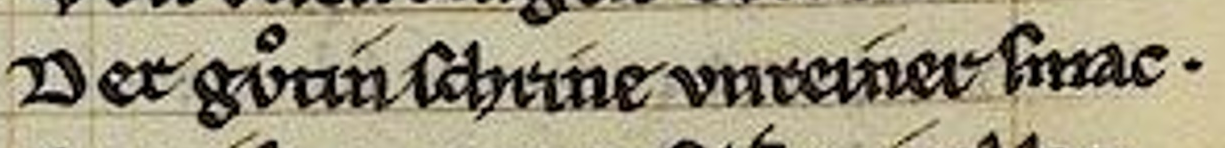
Der gv°otin ſchrine vnreiner ſmac.
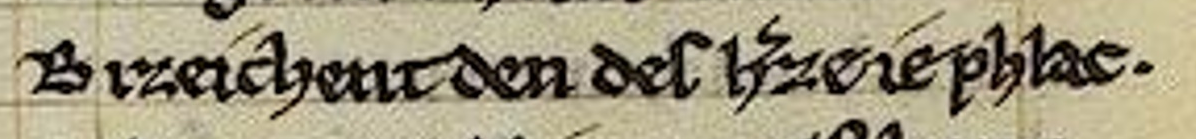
Bizeichent den deſ h(er)ze ie phlac.
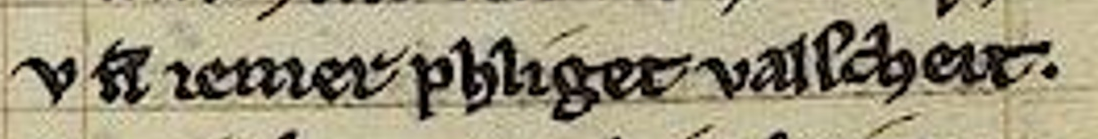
Vn(d) iemer phliget valſcheit.
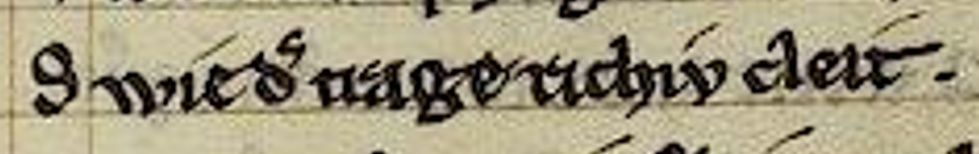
Swie d(er) trage richiv cleit.
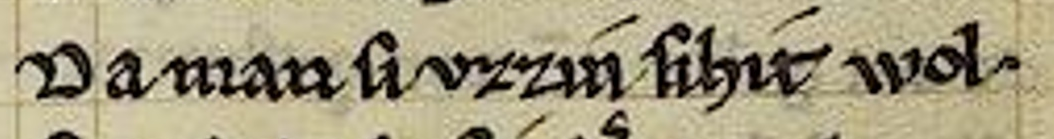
Da man ſi vzzin ſihit wol.
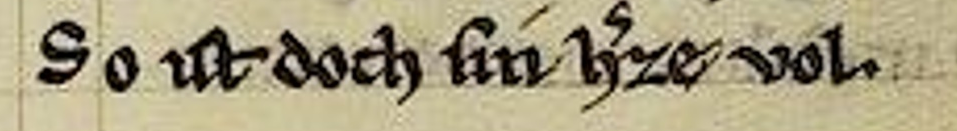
So iſt doch ſin h(er)ze vol.
